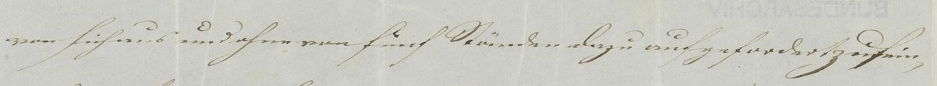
von sich aus und ohne von fünf Ständen dazu aufgefordert zu sein,
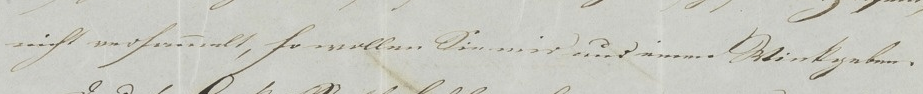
nicht versammelt, so wollen Sie mir nur einen Wink geben.
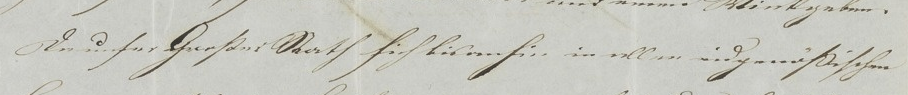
Da unser Großer Rath sich bisanhin in allen eidgenößischen
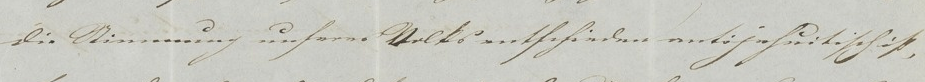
die Stimmung unseres Volks entschieden antijesuitisch ist,
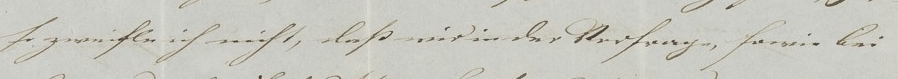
so zweifle ich nicht, daß wir in der Vorfrage, sowie bei
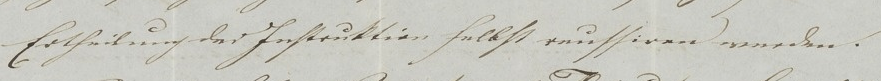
Ertheilung der Instruktion selbst reussiren werden.
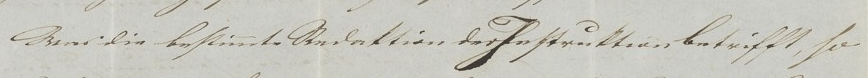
Was die bestimmte Redaktion der Instruktion betrifft, so
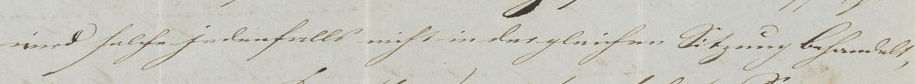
wird solche jedenfalls nicht in der gleichen Sitzung behandelt,
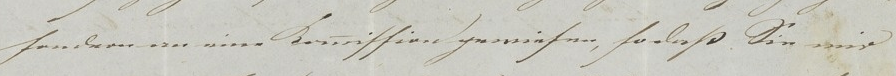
sondern an eine Kommission gewiesen, so daß Sie mir
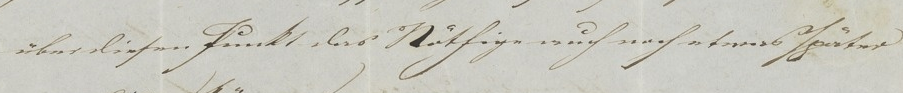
über diesen Punkt das Nöthige auch noch etwas später
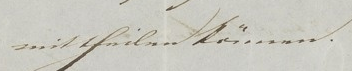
mittheilen können.
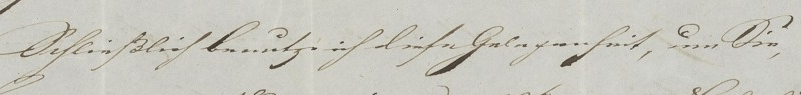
Schließlich benutze ich diese Gelegenheit, um sie,
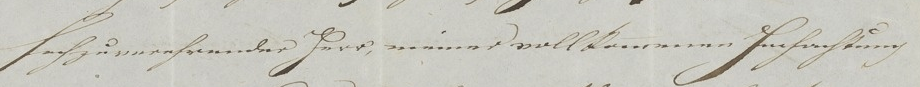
hochzuverehrender Herr, meiner vollkommenen Hochachtung
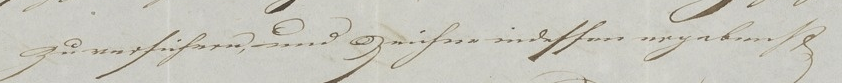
zu versichern, und zeichne indessen ergebenst
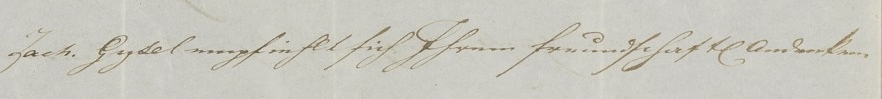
Zach. Gysel empfiehlt sich Ihrem freundschaftlichen Andenken
